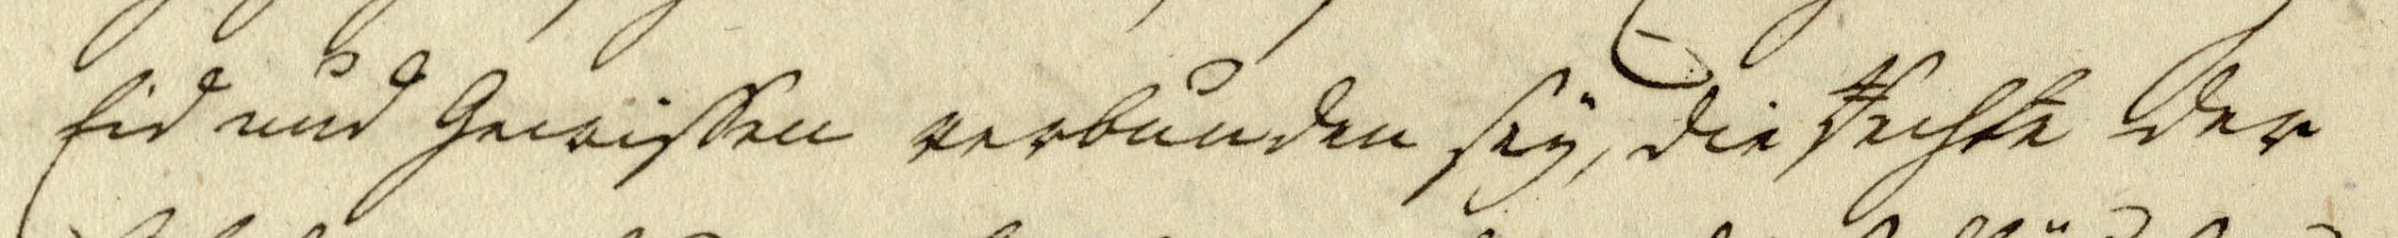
Eid und Gewissen verbunden seÿ, die Rechte der
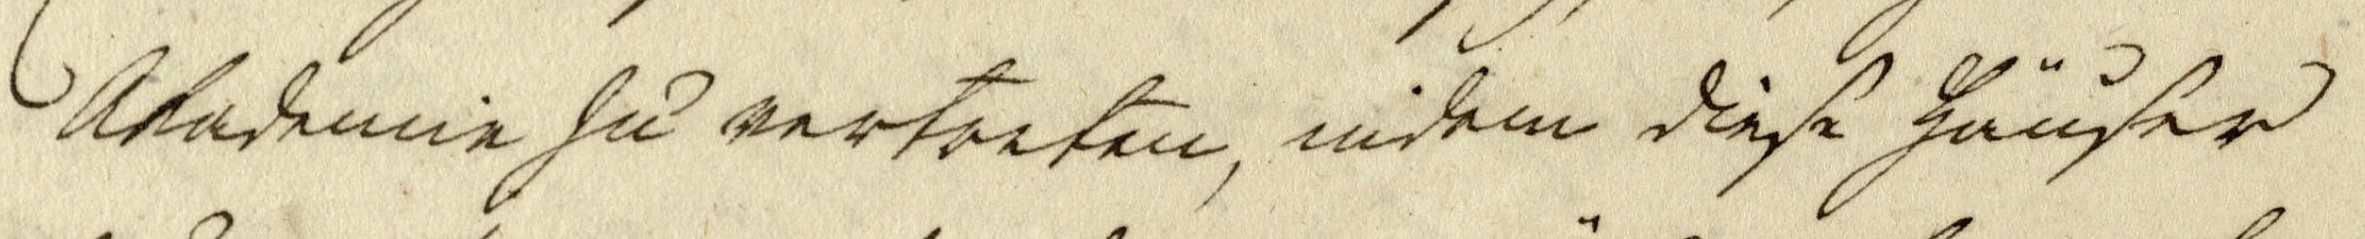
Akademie zu vertreten, indem diese Häuser
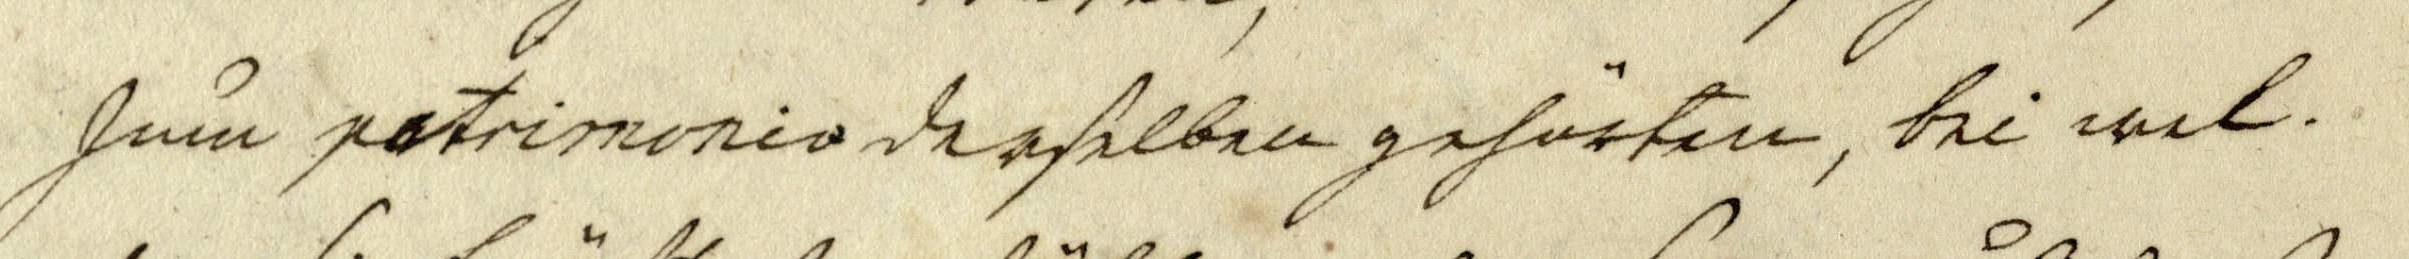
zum patrimonio derselben gehörten, bei wel¬
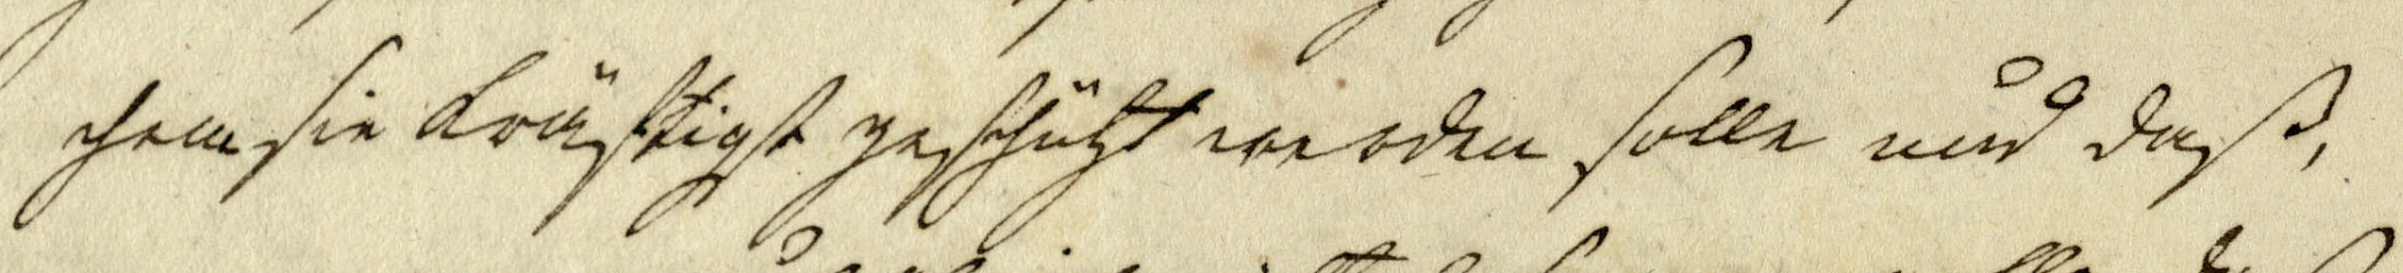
chem sie kräftigst geschützt werden solle und daß,
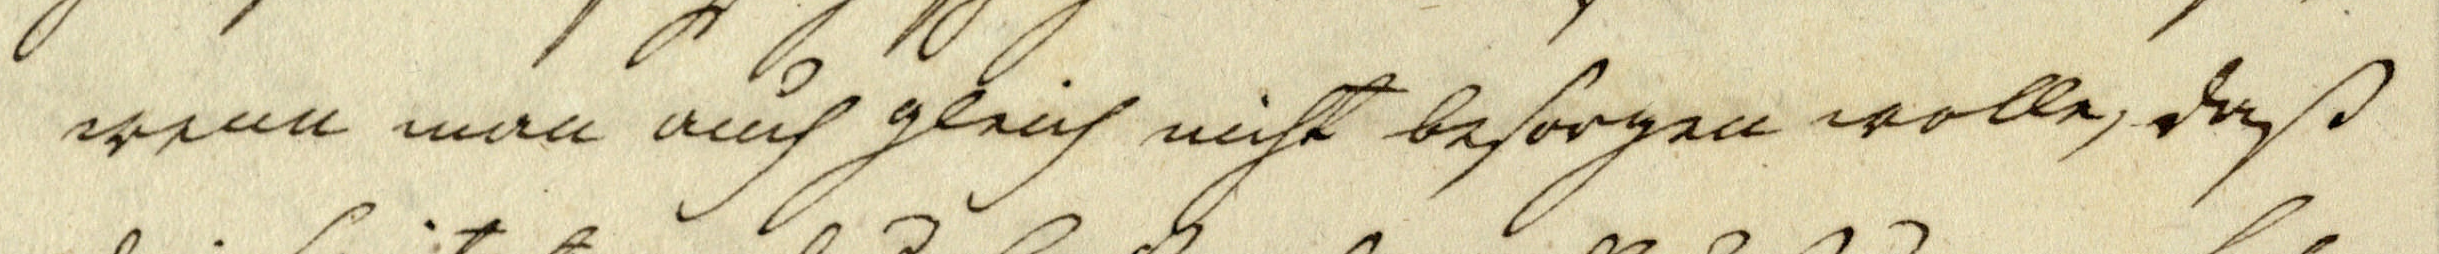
wenn man auch gleich nicht besorgen wolle, daß
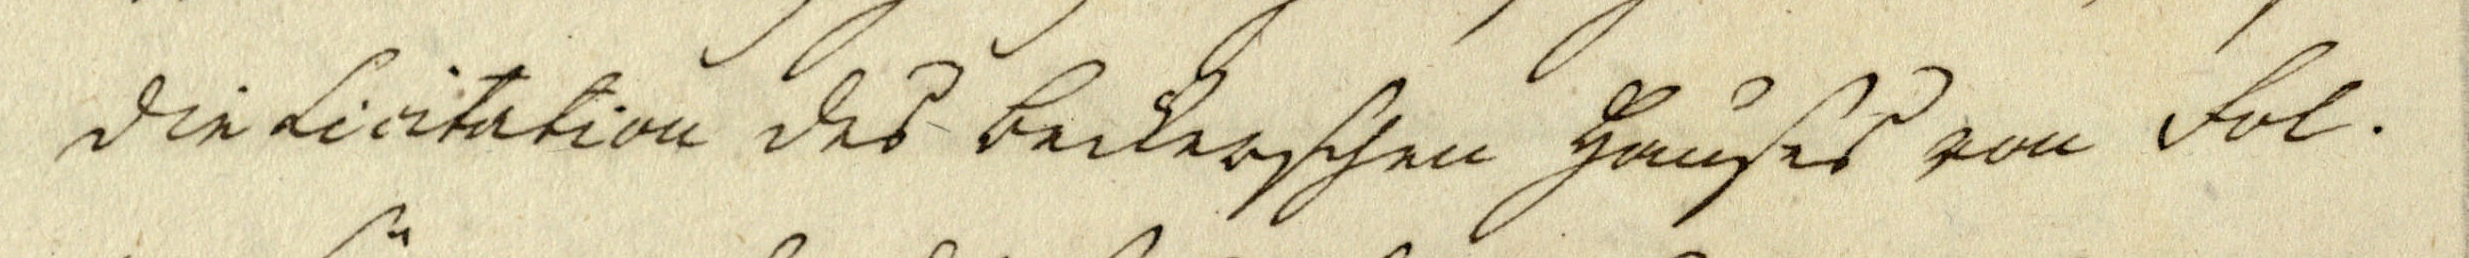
die Licitation des Beckerschen Hauses von Fol¬
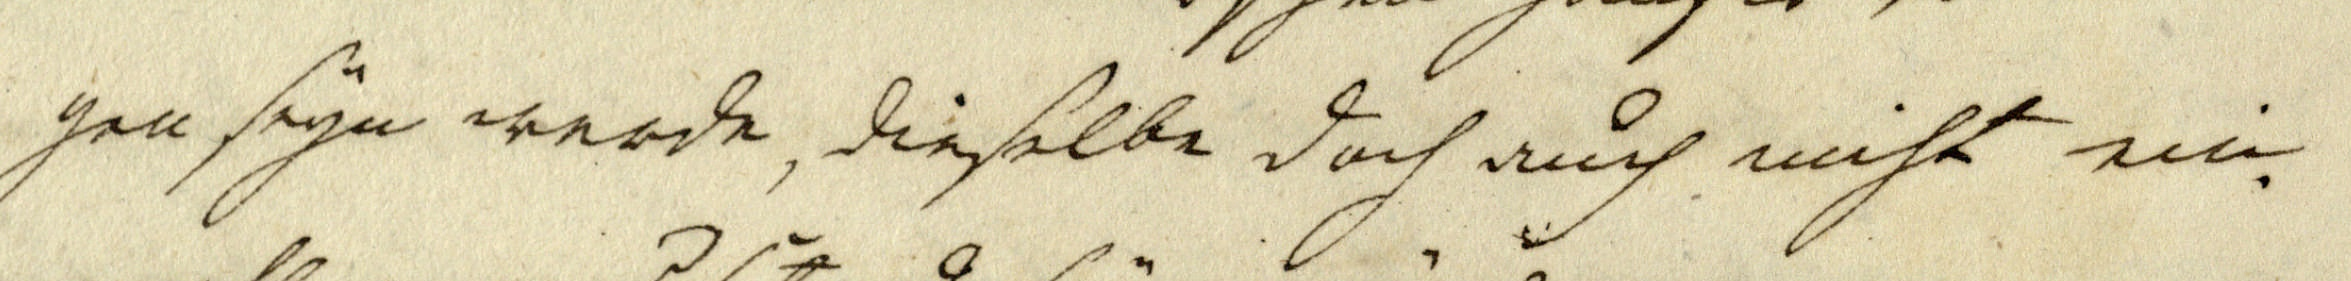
gen seÿn werde, dieselbe doch auch nicht ein¬
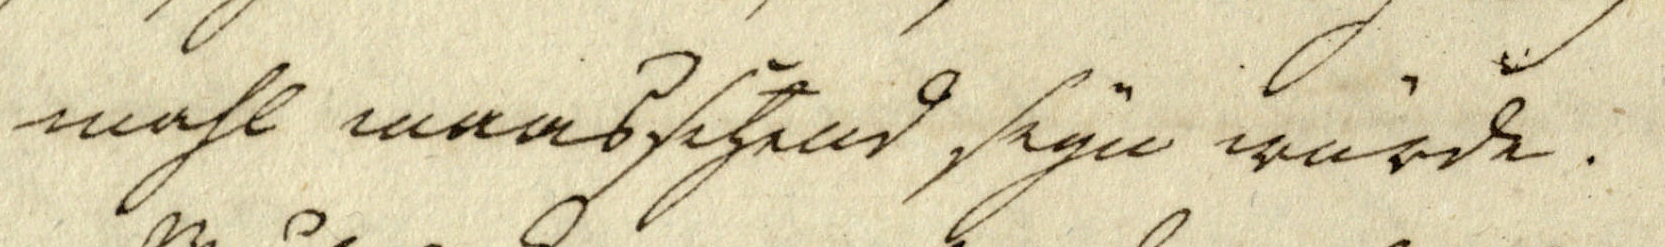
mahl maassetzend seÿn würde.
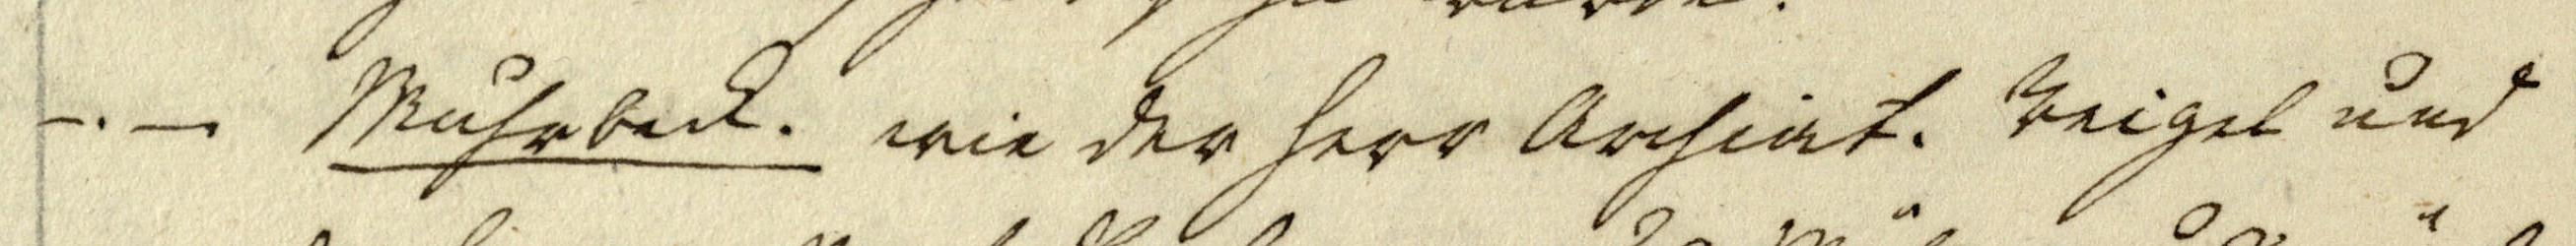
Muhrbeck. wie der Herr Archiat. Weigel und
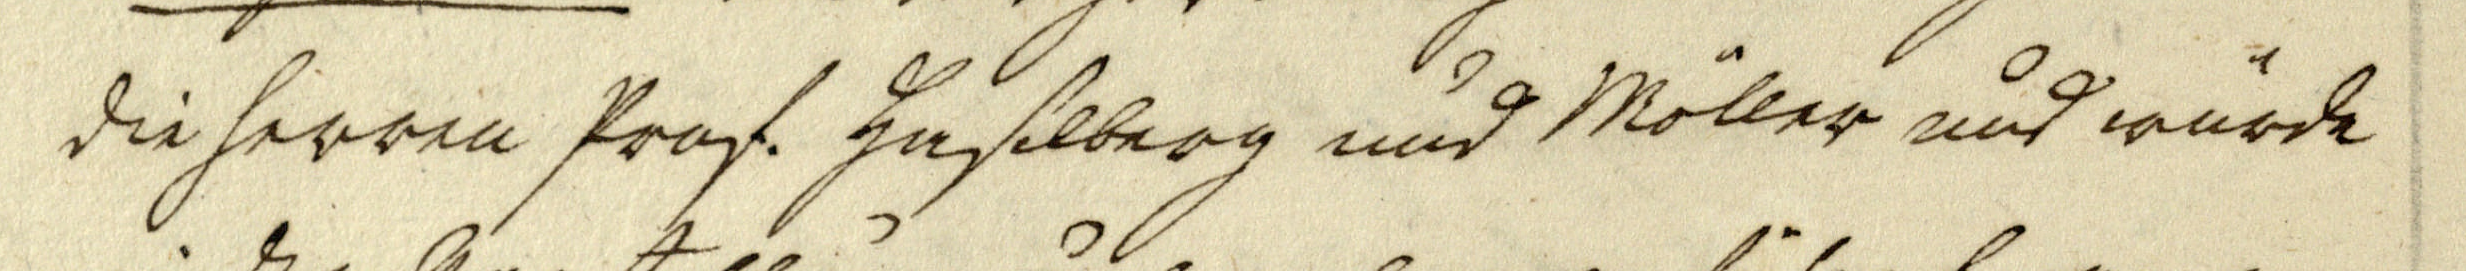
die Herren Prof. Haselberg und Möller und würde
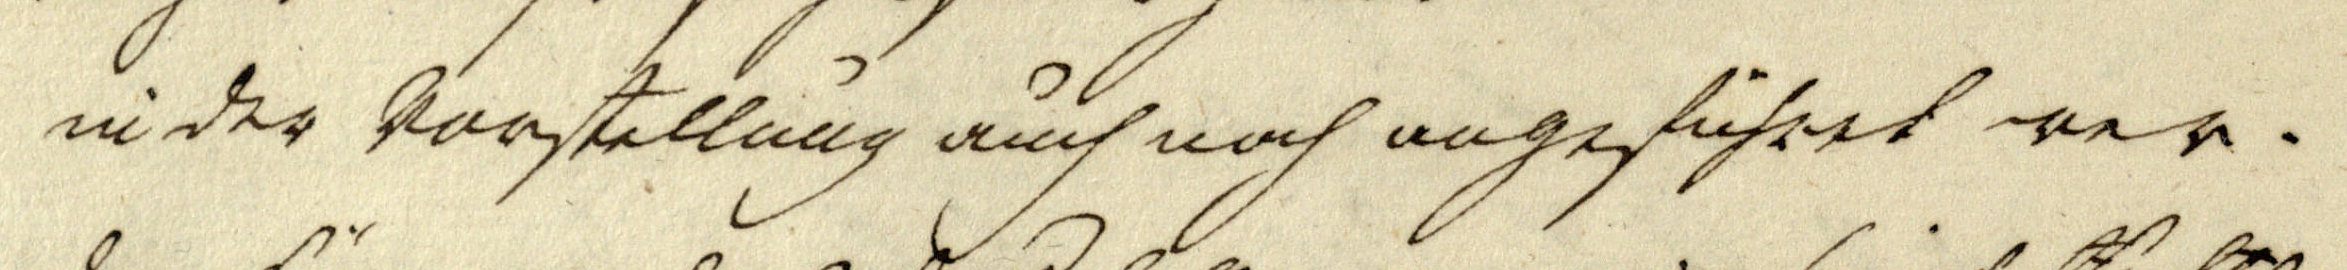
in der Vorstellung auch noch angeführet wer¬
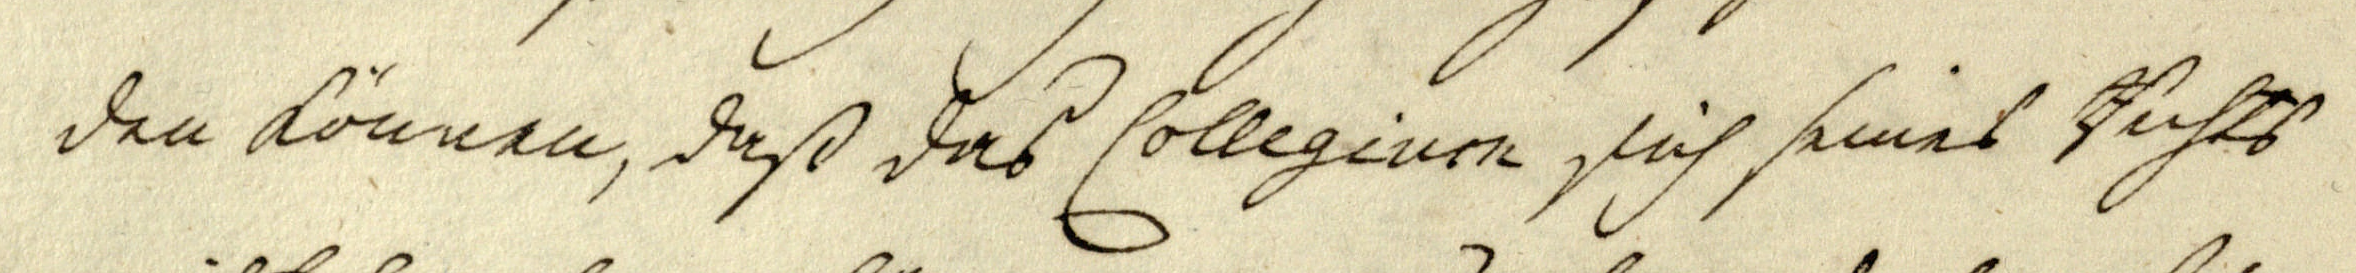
den können, daß das Collegium sich seines Rechts
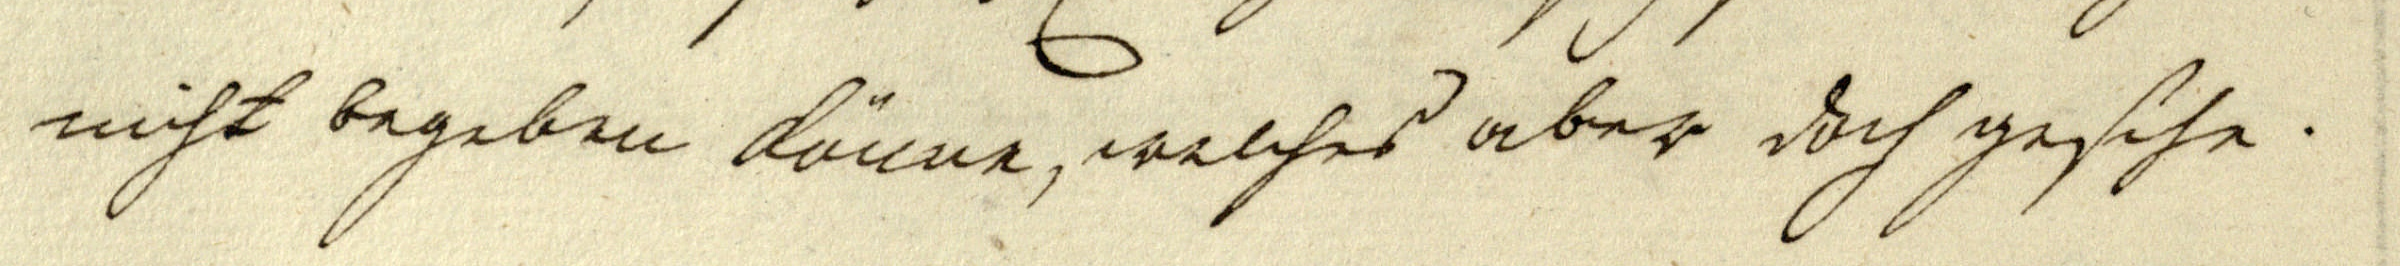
nicht begeben könne, welches aber doch gesche¬
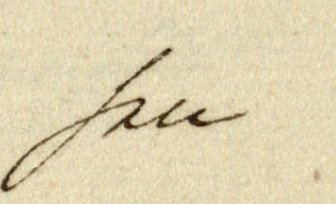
hen
